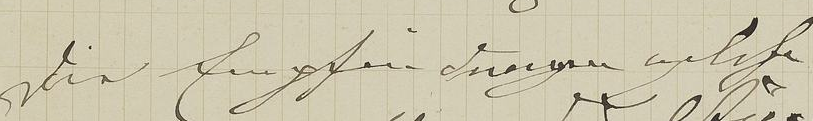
Die Empfindungen welche
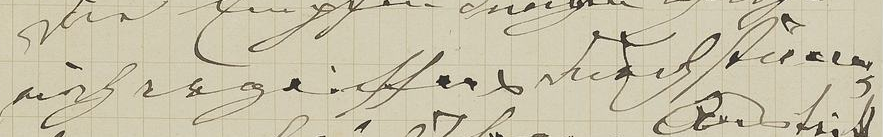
mich ergriffen & durchstürm-
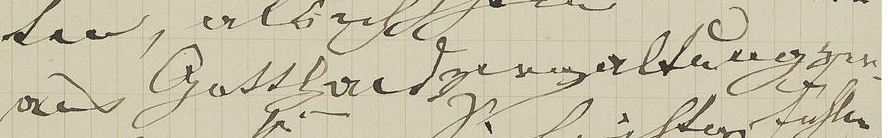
aus Gotthardverwaltung ver-
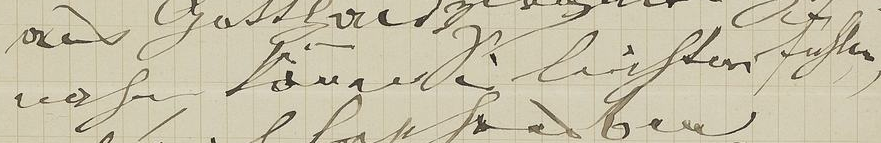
nahm, können Sie leichter fühlen,
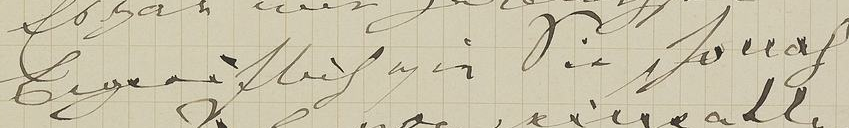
begreiflich wie Sie, so nah
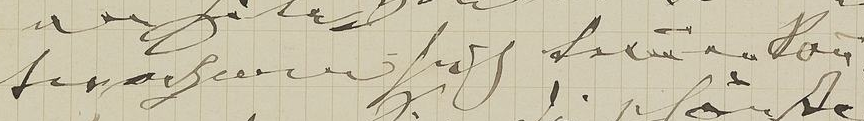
ternehmen sich trennen konn-
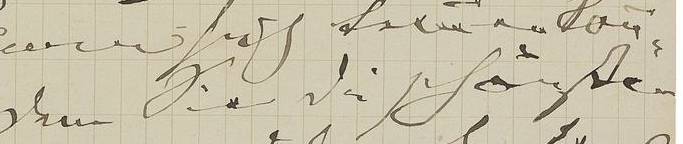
ten, dem Sie die schönsten
